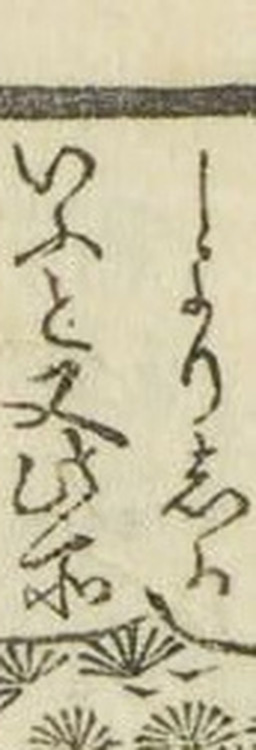いふと又此所
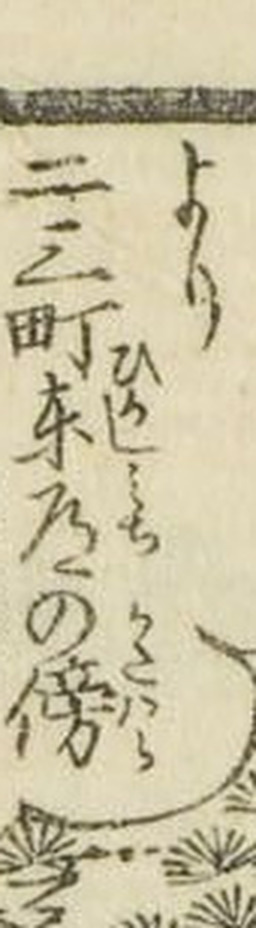二三町東道の傍
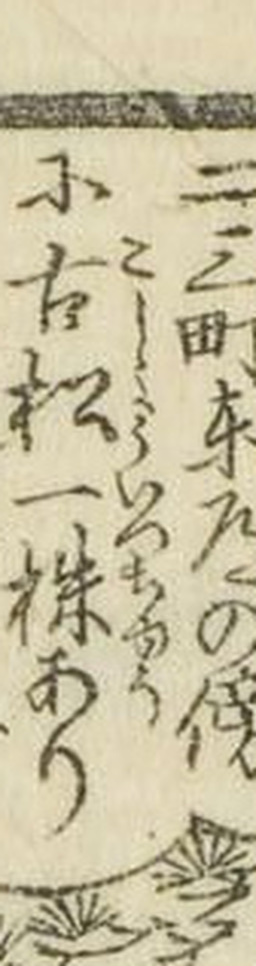に古松一株あり
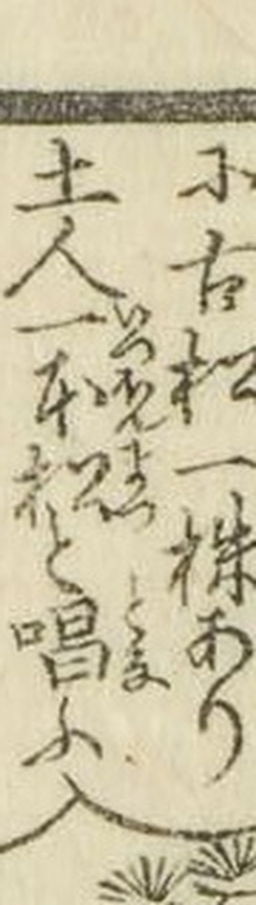土人一本松と唱ふ
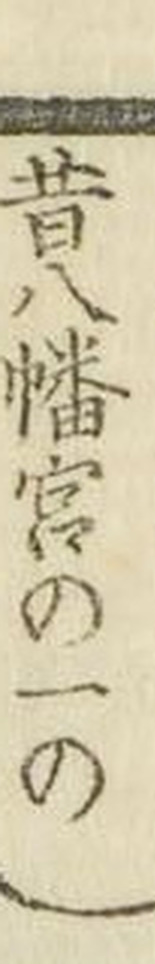昔八幡宮の一の
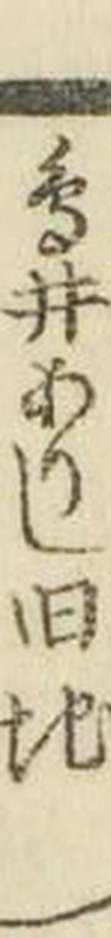鳥井ありし旧地
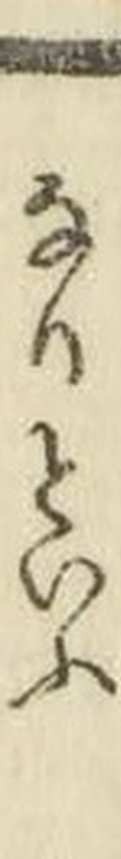なりといふ
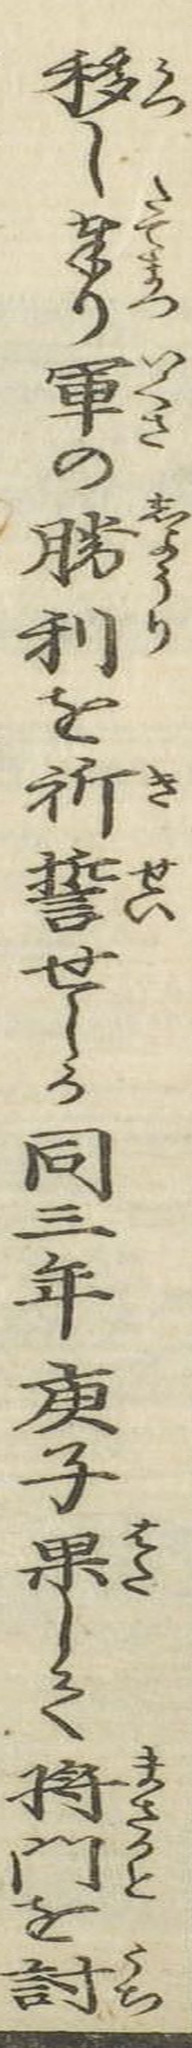移し奉り軍の勝利を祈誓せしか同三年庚子果して将門を討
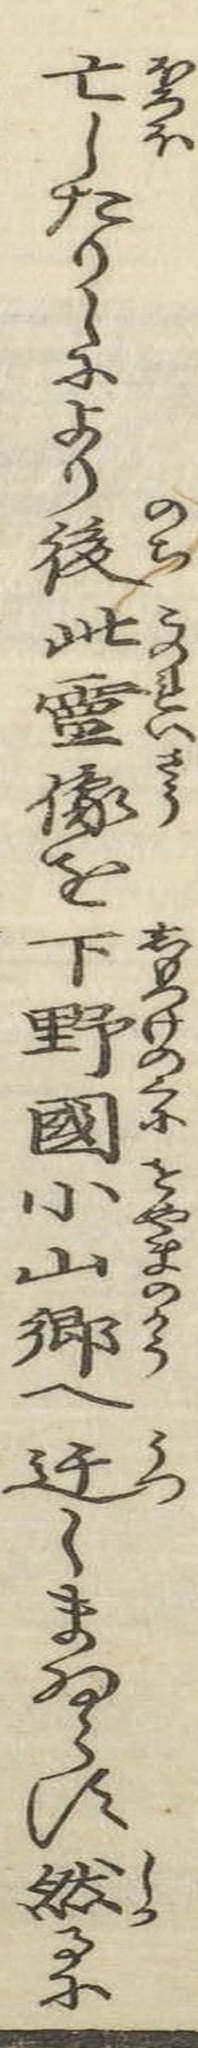亡したりしにより後此霊像を下野国小山郷へ遷しまゐらす然るに
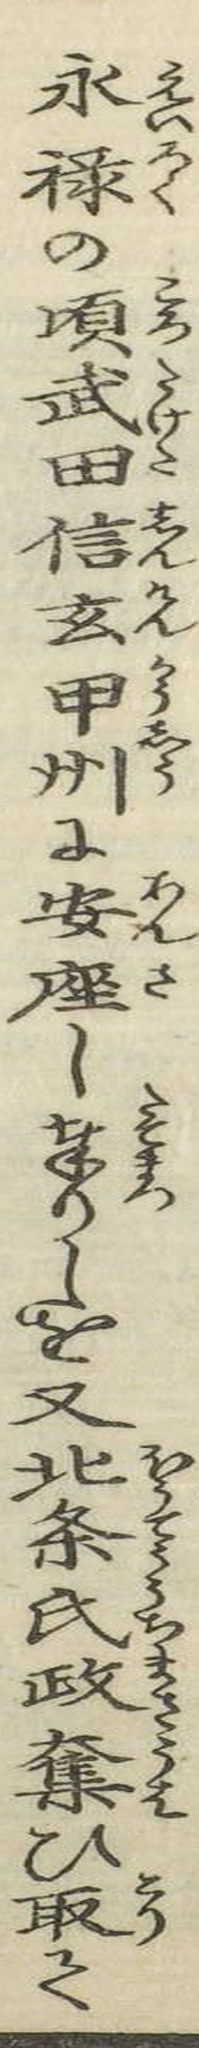永禄の頃武田信玄甲州に安座し奉りしを又北条氏政奪ひ取て
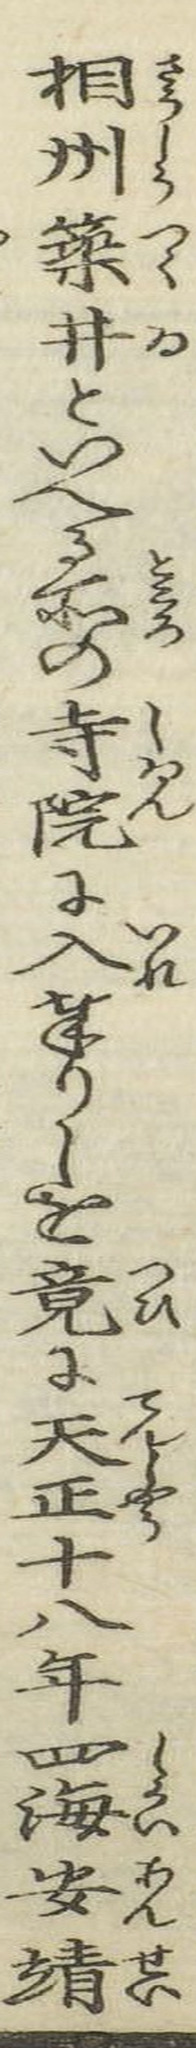相州筑井といへる所の寺院に入奉りしを竟に天正十八年四海安靖
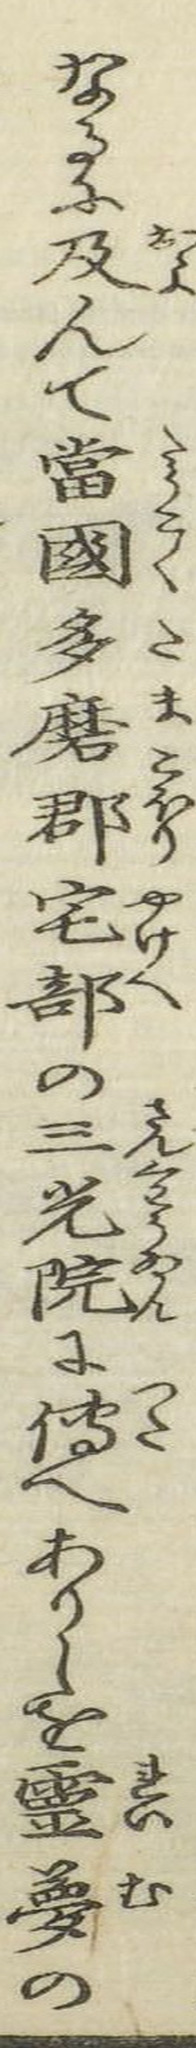なるに及んて当国多摩郡宅部の三光院に伝へありしを霊夢の
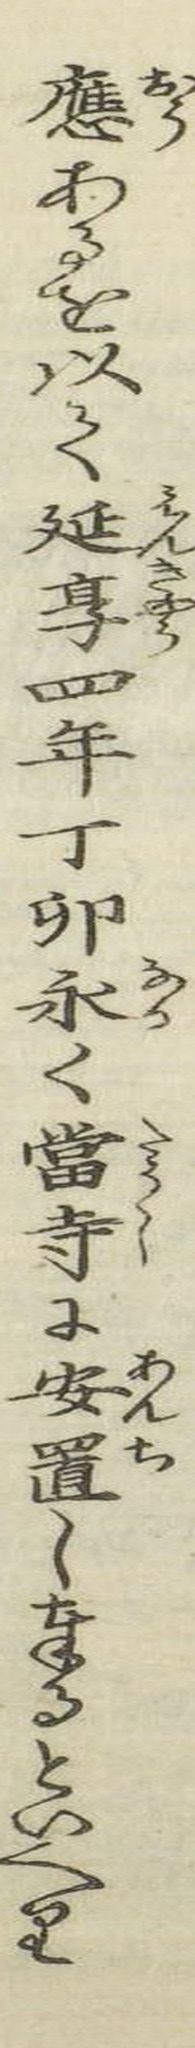応あるを以て延享四年丁卯永く当寺に安置し奉るといへり
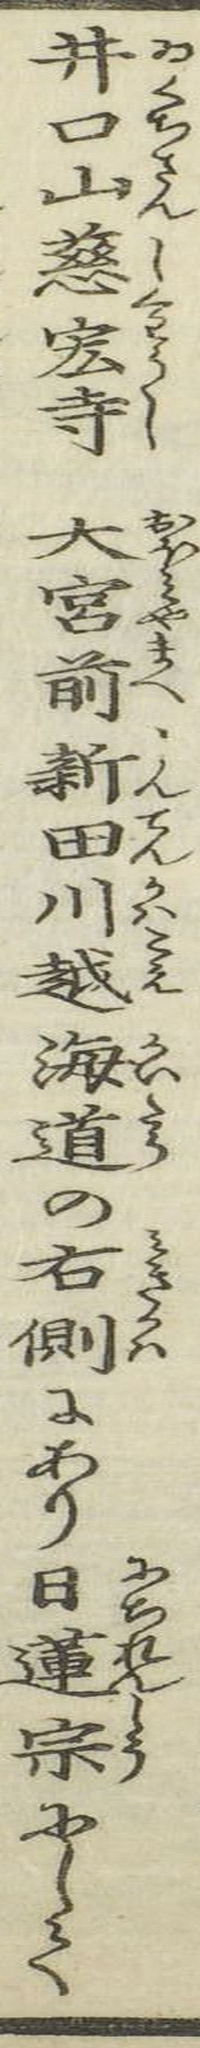井口山慈宏寺大宮前新田川越海道の右側にあり日蓮宗にして
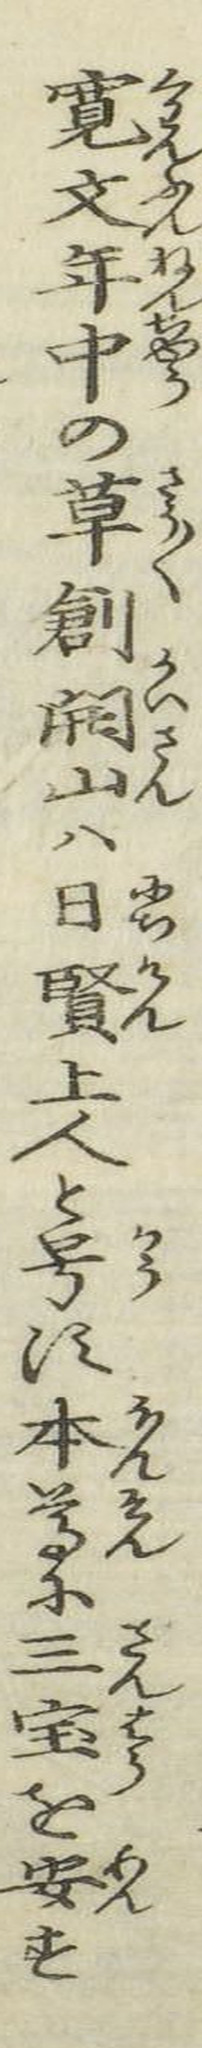寛文年中の草創開山は日賢上人と号す本尊に三宝を安す
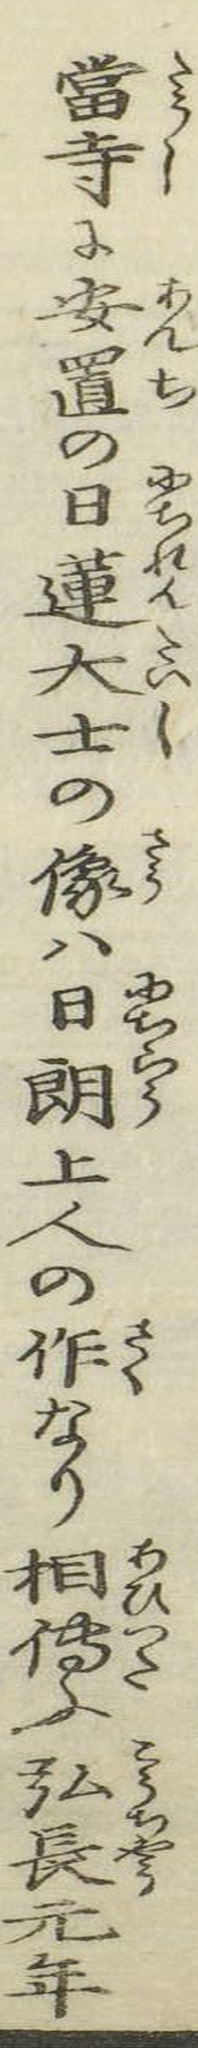当寺に安置の日蓮大士の像は日朗上人の作なり相伝ふ弘長元年
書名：江戸名所図会 20巻 巻之11
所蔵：東京学芸大学教育コンテンツアーカイブ
